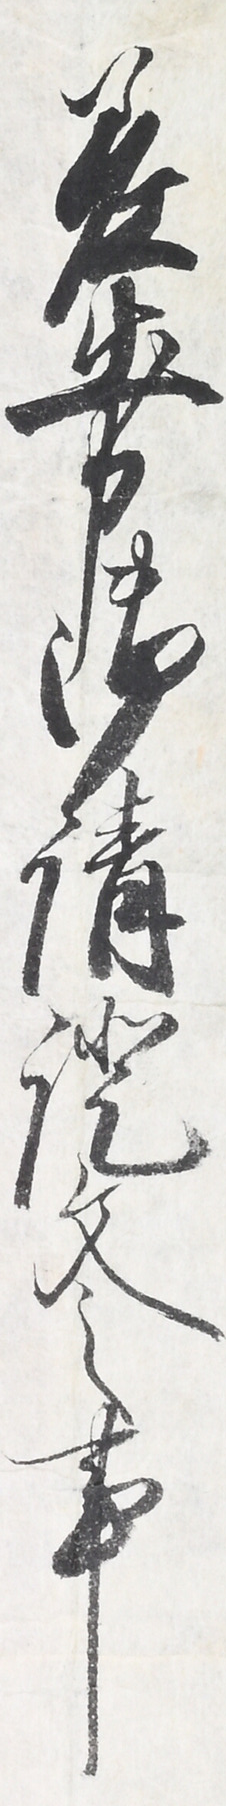差上申御請証文之事
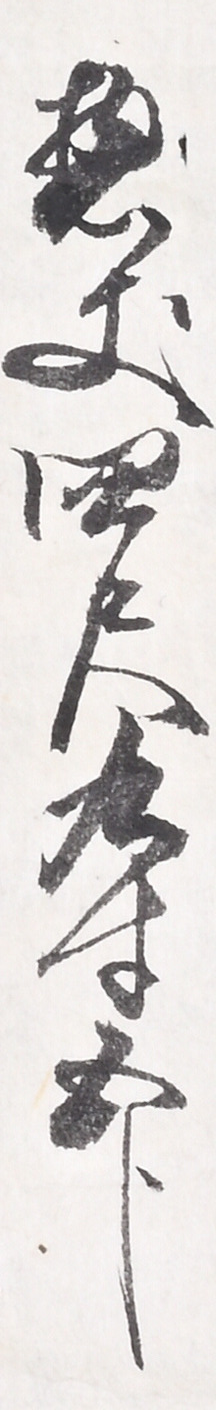惣丈四尺九寸五分
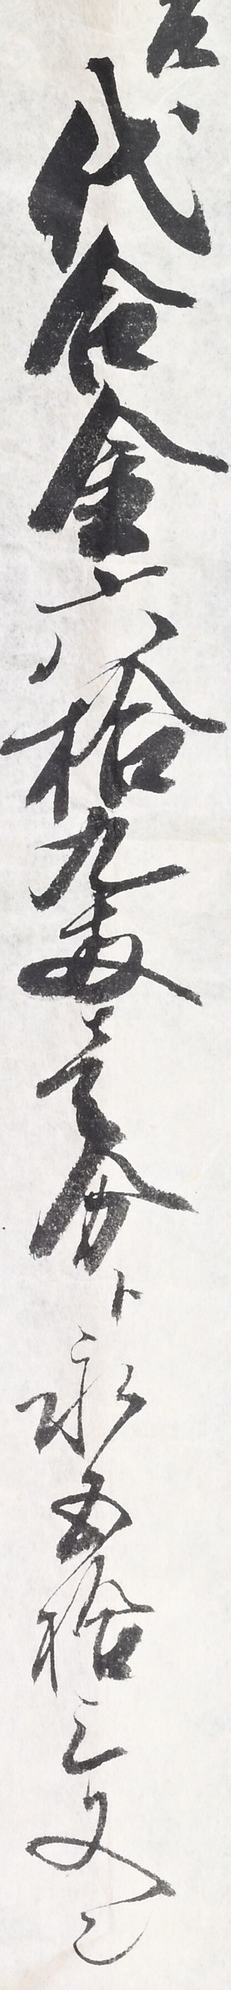元代合金六拾九両壱分ト永五拾三文也
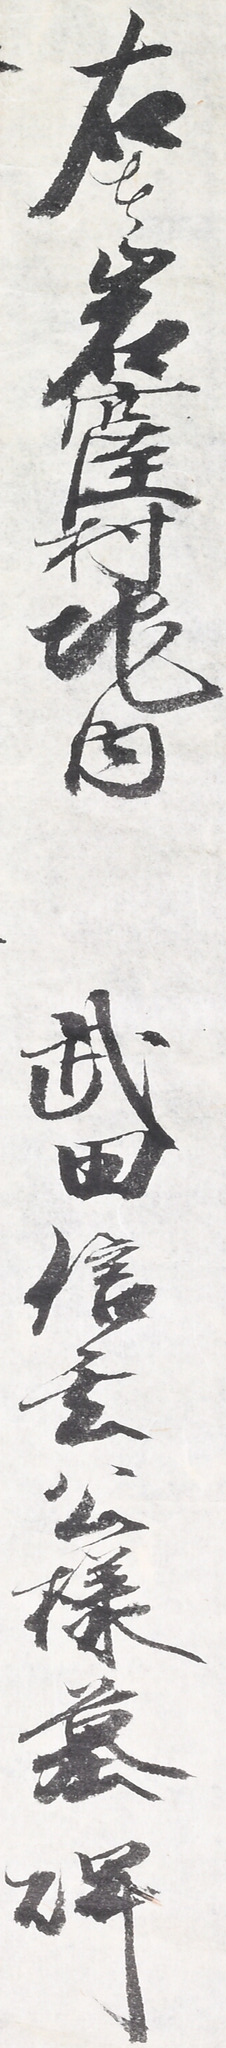右者岩窪村地内武田信玄公様墓碑
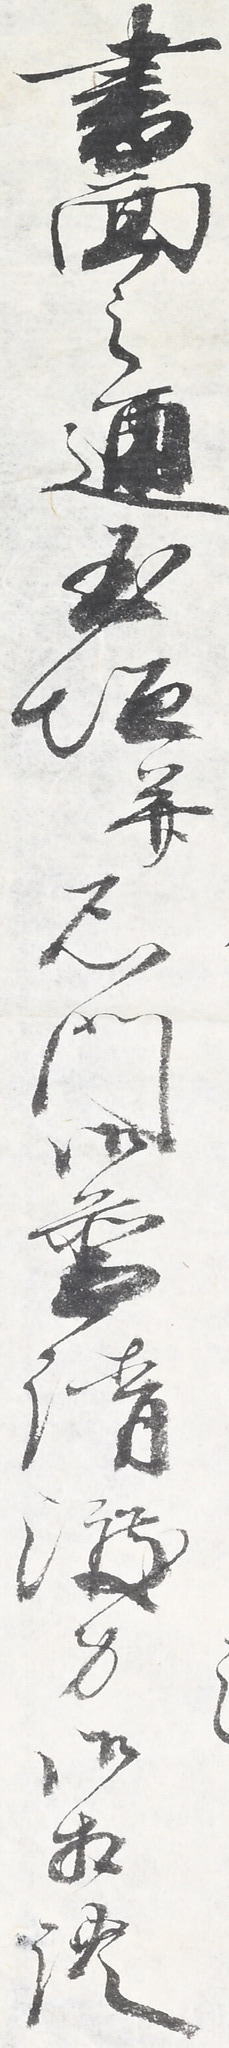書面之通玉垣并石門御普請渡方御相談
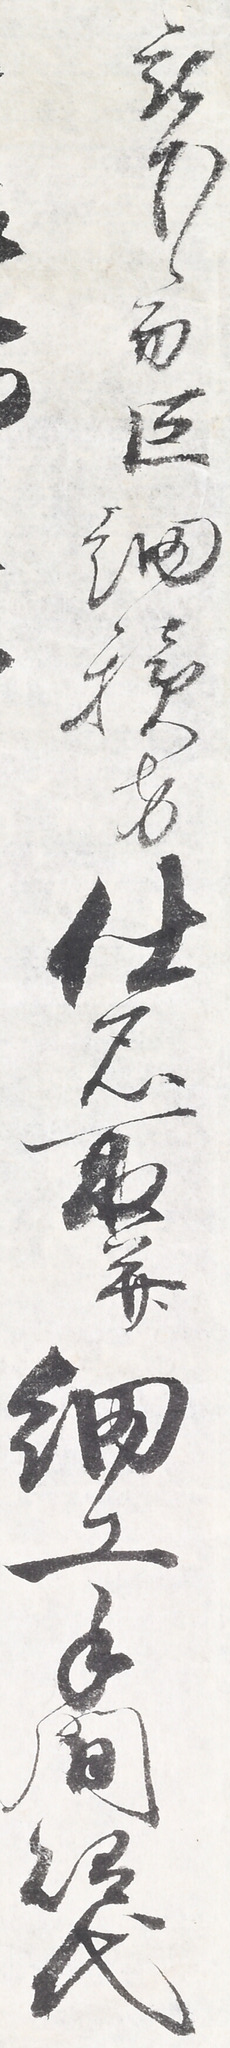被下候而巨細積方仕石取并細工手間賄代
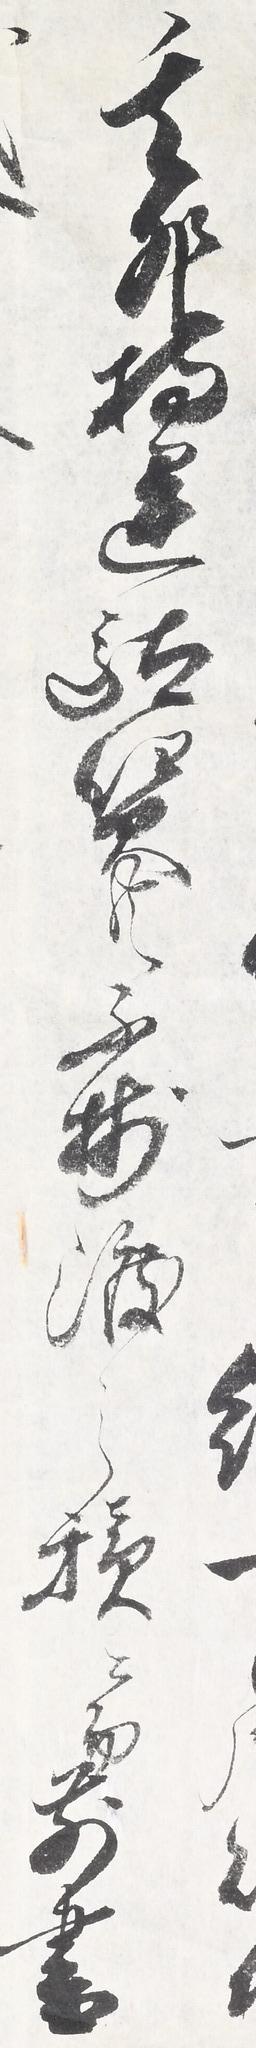其外持運駄賃共不残渡之積ニ而前書
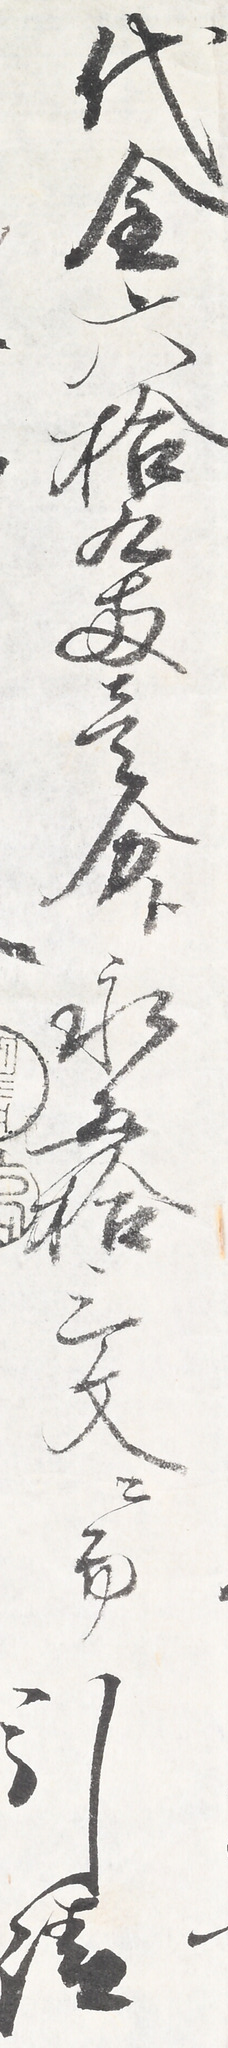代金六拾九両壱分ト永五拾三文ニ而引請
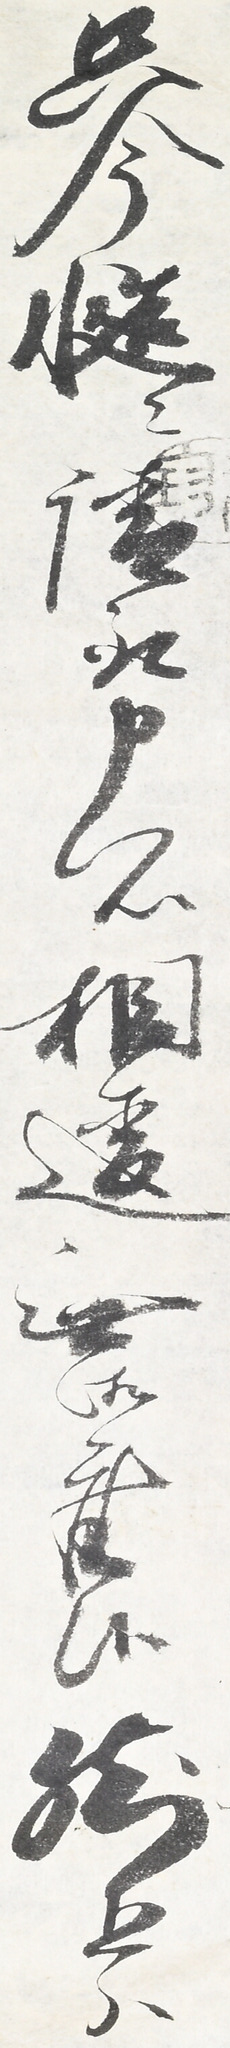只今慥ニ請取申所相違無御座候然上ハ
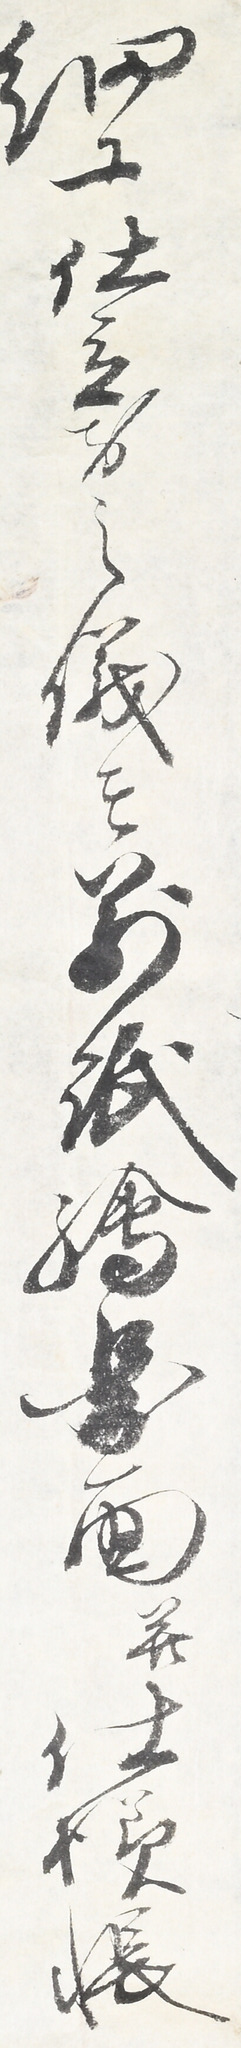細工仕立方之儀者別紙絵図面并仕様帳
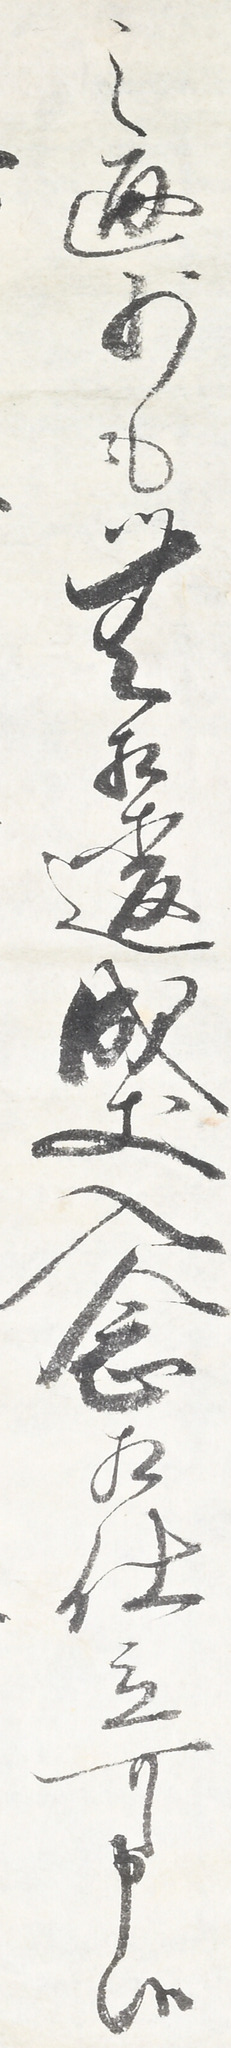之通少も無相違成丈入念相仕立可申候
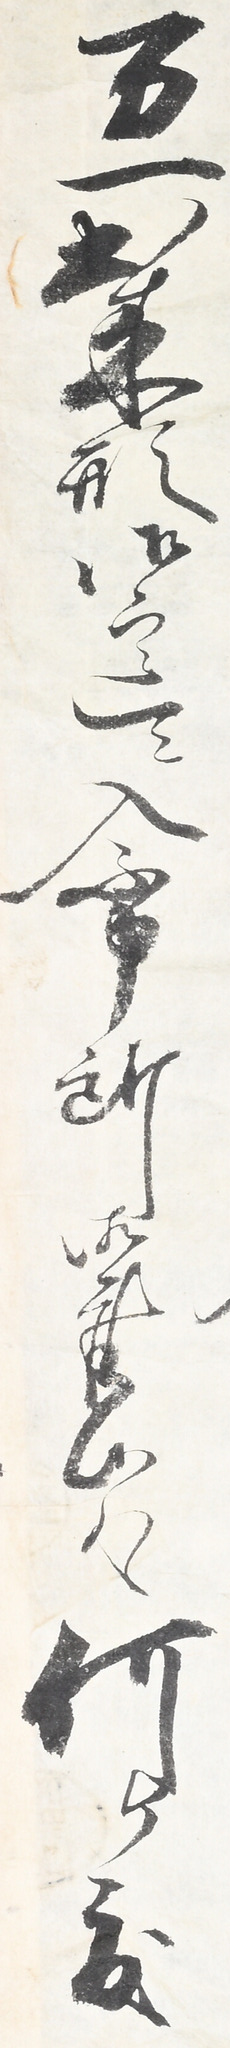万一出来形御意ニ入不申所御書候ハヽ何ヶ度
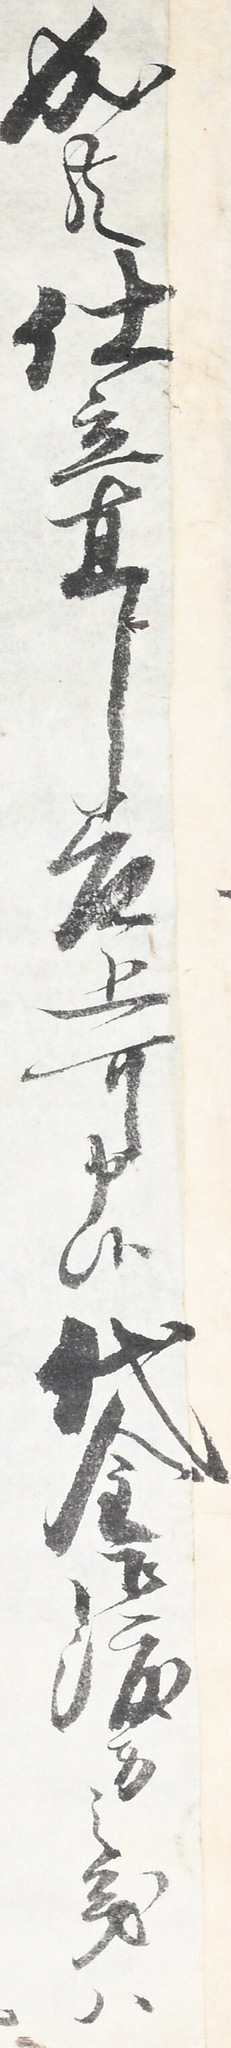成共仕立直申差上可申候代金御渡方之義ハ
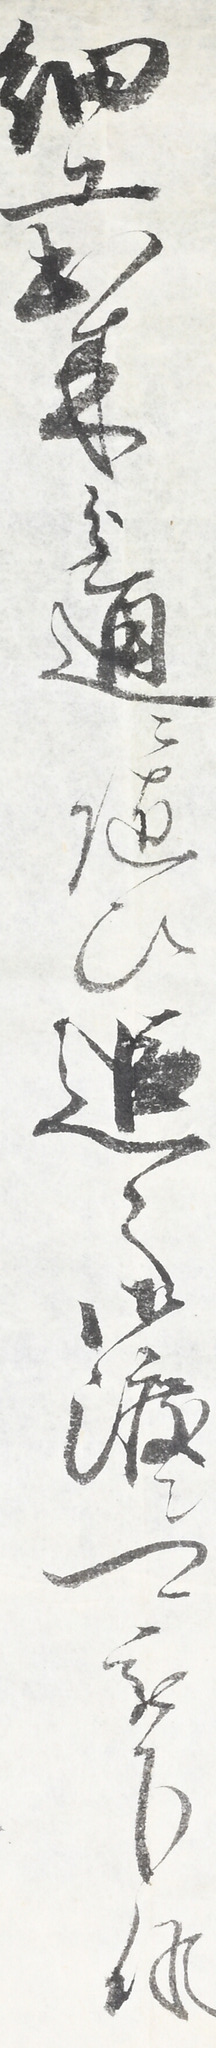細工出来分通ニ遵ひ追々御渡シ可被下候
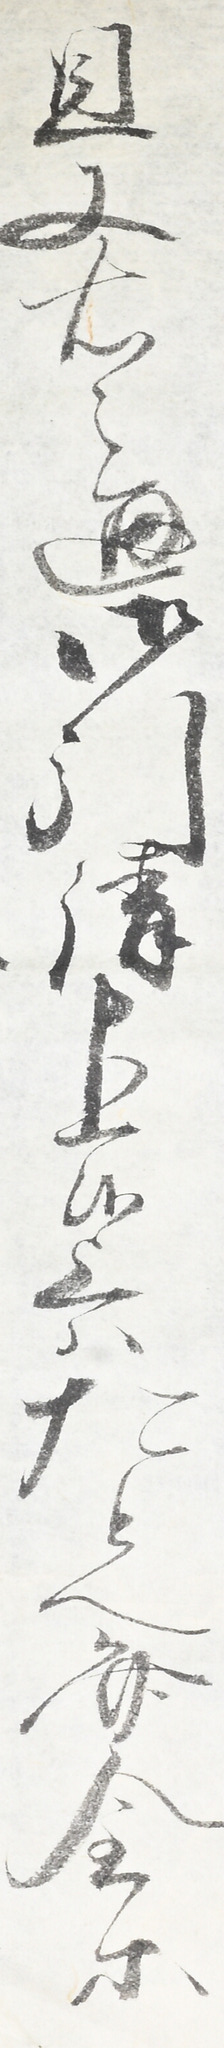且又右之通御引請申上候上ハたとへ弁金等
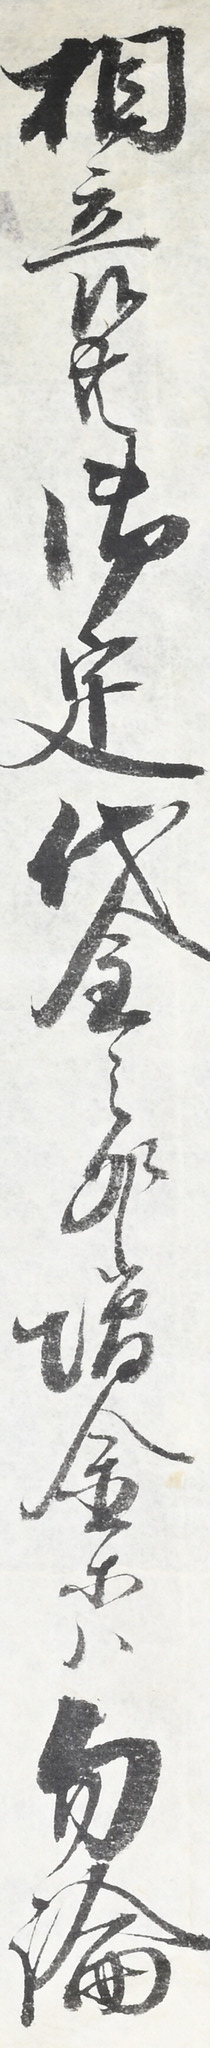相立候共御定代金之外増金等ハ勿論
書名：差出申御請證文之事
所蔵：伊那市立高遠町図書館・合同会社AMANE
